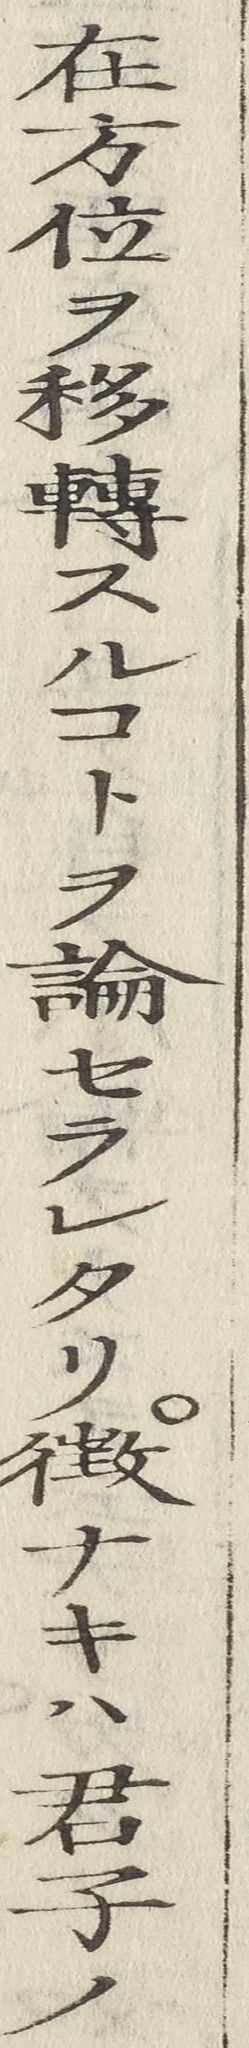在方位ヲ移転スルコトヲ論セラレタリ。徴ナキハ君子ノ
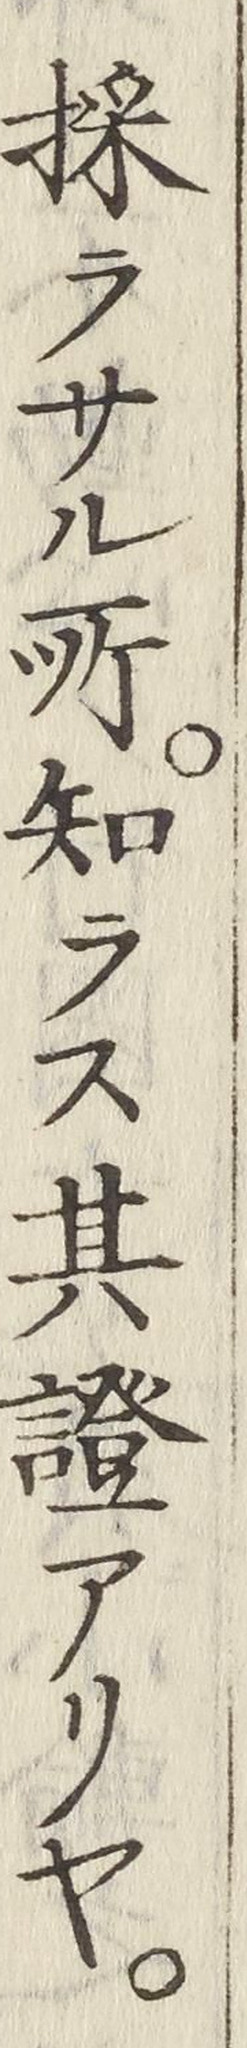採ラサル所。知ラス其証アリヤ。
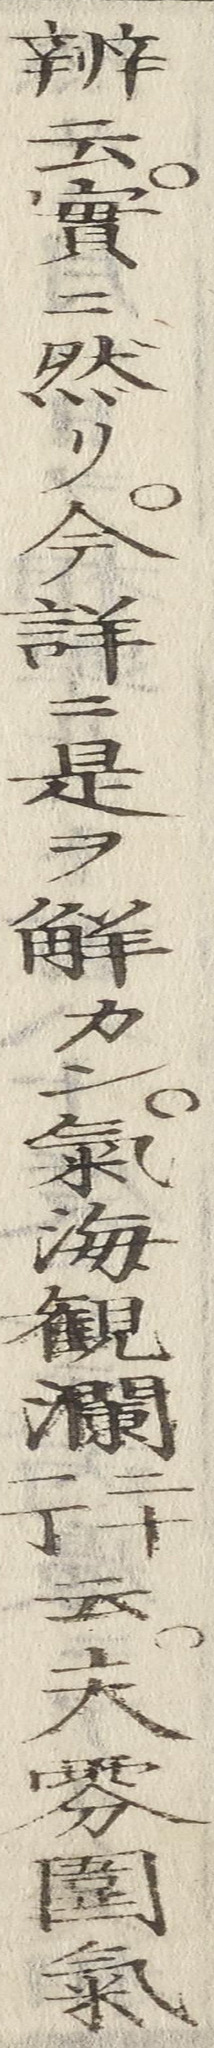弁云。実ニ然リ。今詳ニ是ヲ解カン。気海観瀾二十一丁云。天雰囲気
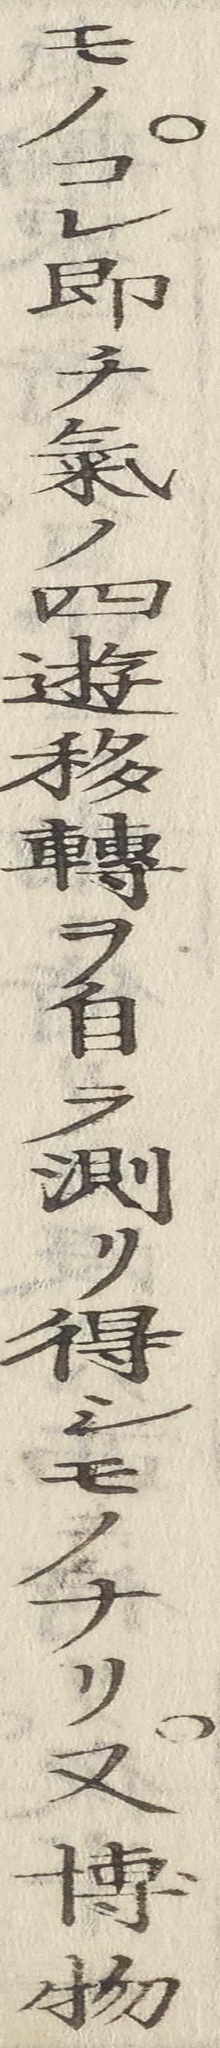モノ。コレ即チ気ノ四游移転ヲ自ラ測リ得シモノナリ。マタ博物
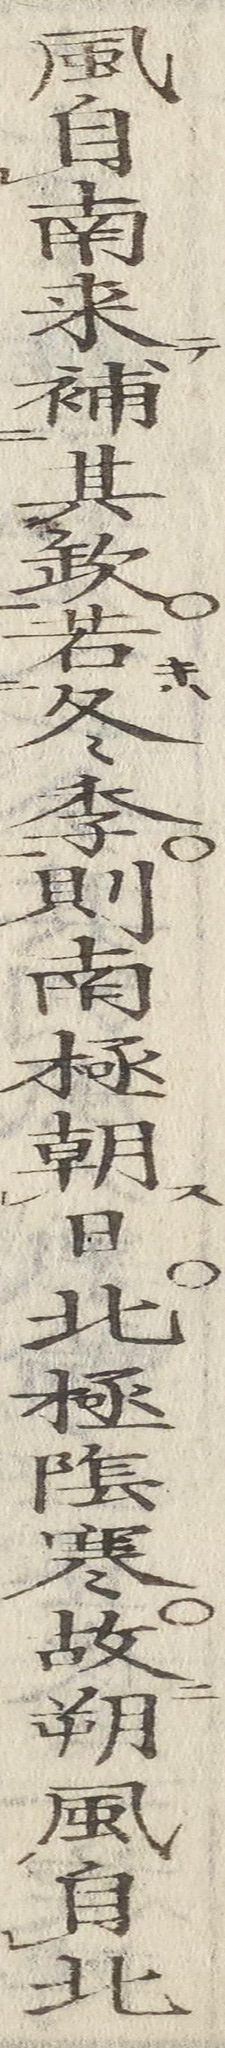風自南来補ニ其欫。若ニ冬季。則南極朝日。北極陰寒。故朔風自北
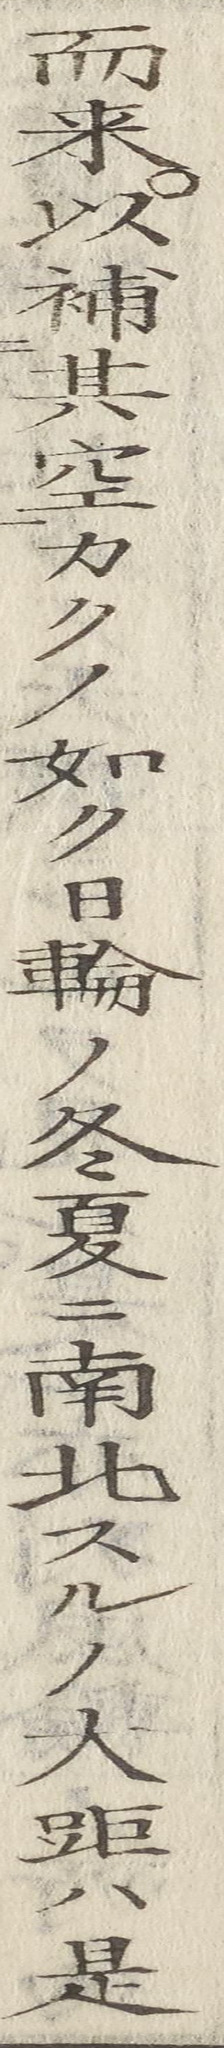而来。以補ニ其空カクノ如ク日輪ノ冬夏ニ南北スルノ大距ハ是
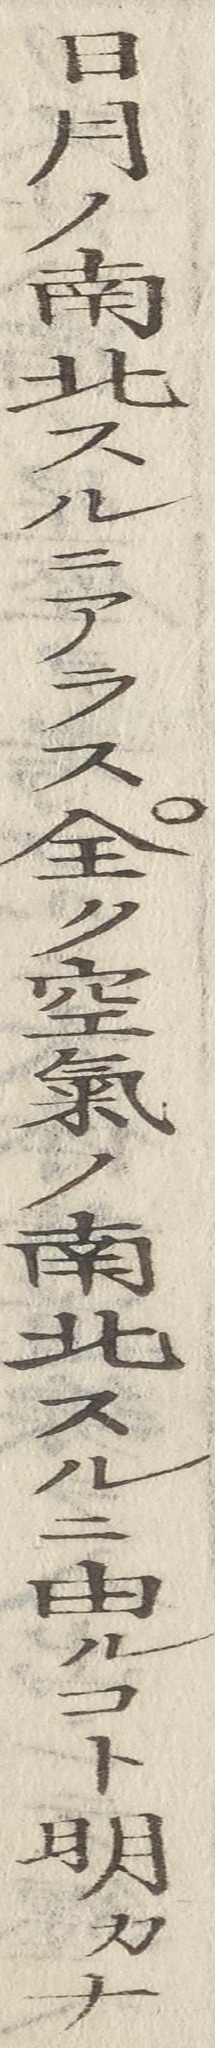日月ノ南北スルニアラス。全ク空気ノ南北スルニ由ルコト明カナ

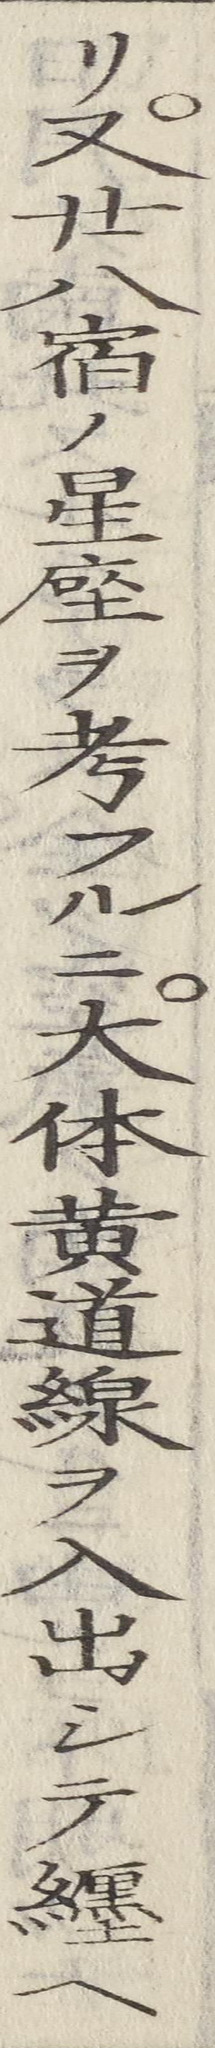リ。又廿八宿ノ星座ヲ考フルニ。大体黄道線ヲ入出シテ纏ヘ
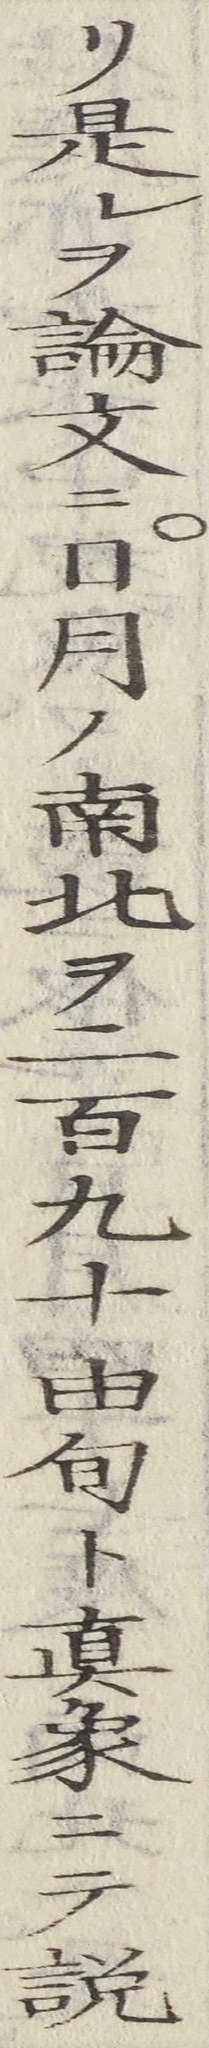リ是レヲ論文ニ。日月ノ南北ヲ二百九十由旬ト直象ニテ説
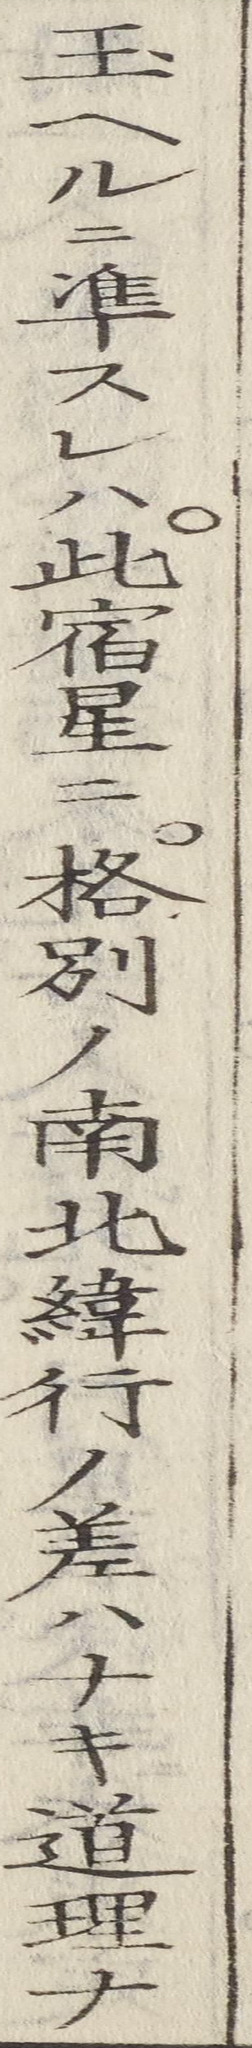玉ヘルニ準スレハ。此宿星ニ。格別ノ南北緯行ノ差ハナキ道理ナ
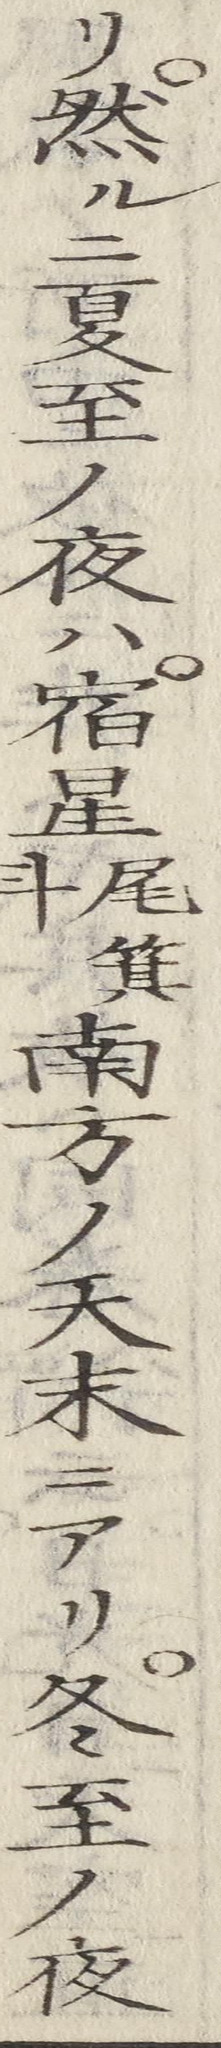リ。然ルニ夏至ノ夜ハ。宿星尾箕斗南方ノ天末ニアリ。冬至ノ夜
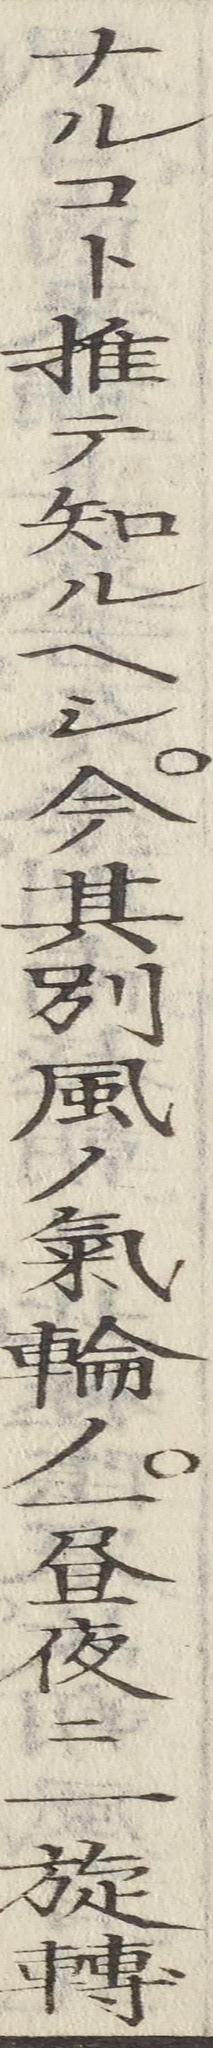ナルコト推テ知ルヘシ。今其別風ノ気輪ノ。一昼夜ニ一旋転
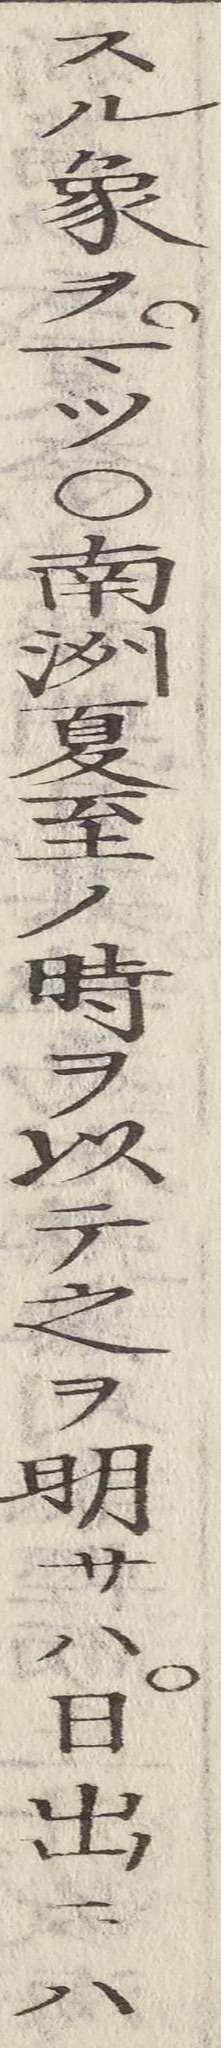スル象ヲ。マツ〇南洲夏至ノ時ヲ以テ之ヲ明サハ。日出ニハ
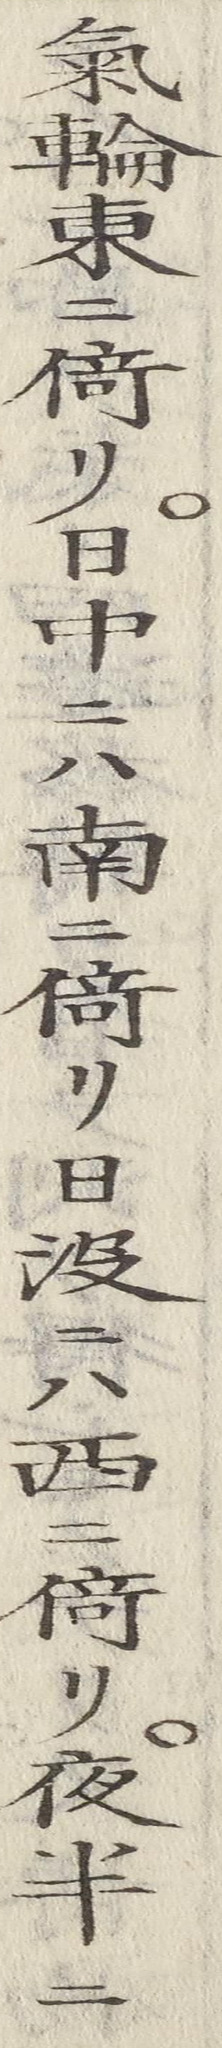気輪東ニ倚リ。日中ニハ南ニ倚リ日没ニハ西ニ倚リ。夜半ニ
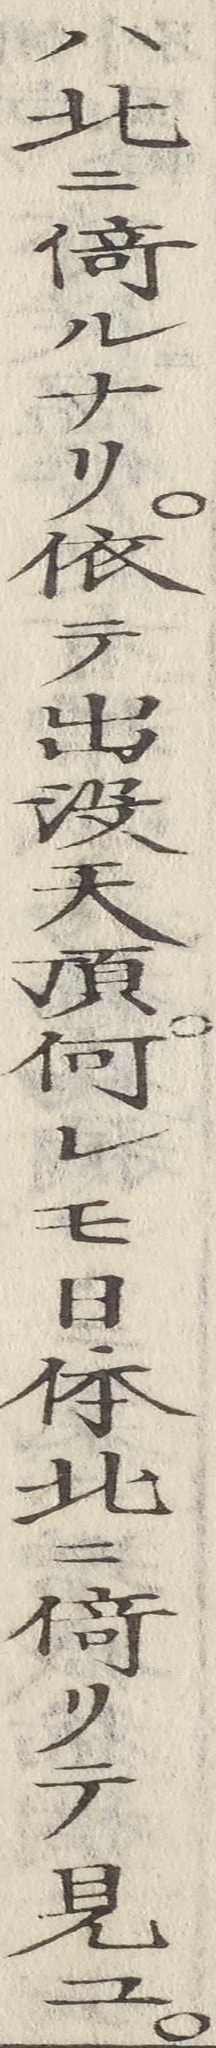ハ北ニ倚ルナリ。依テ出没天頂。何レモ日体北ニ倚リテ見ユ。
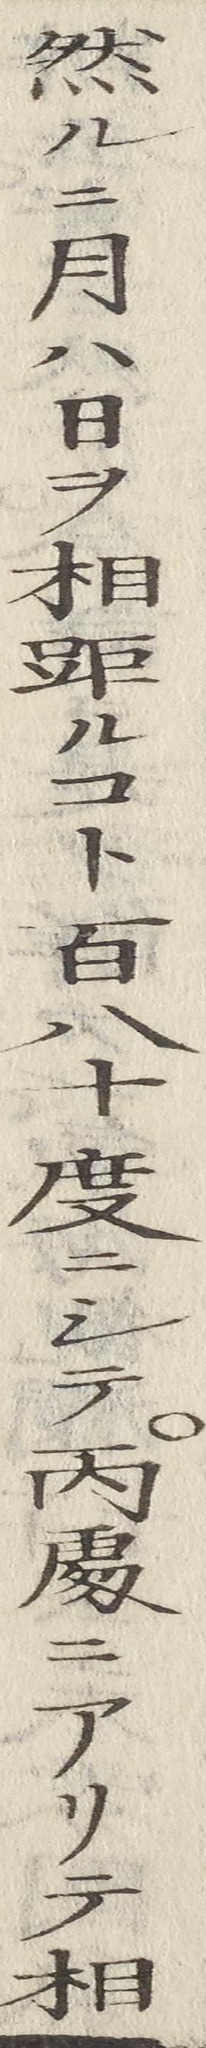然ルニ月ハ日ヲ相距ルコト百八十度ニシテ。丙処ニアリテ相
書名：護法新論　二編　上
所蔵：東京大学地震研究所図書室 Earthquake Research Institute Library, The University of Tokyo, JAPAN
